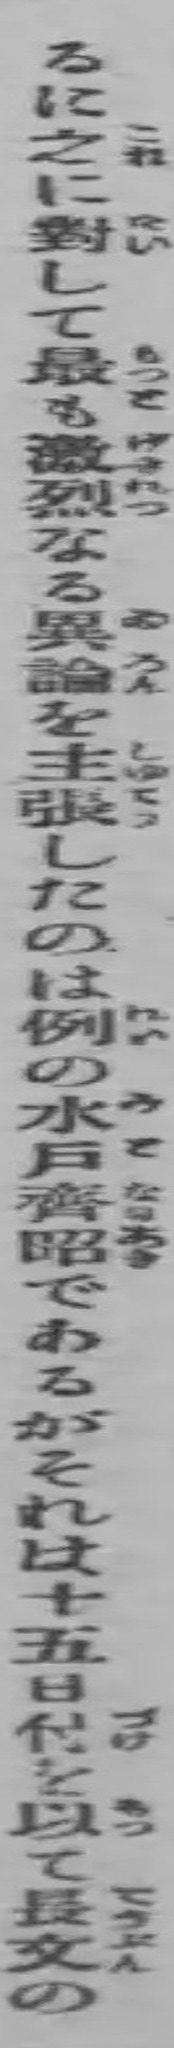るに之に対して最も激烈なる異論を主張したのは例の水戸斉昭であるがそれは十五日付を以て長文の
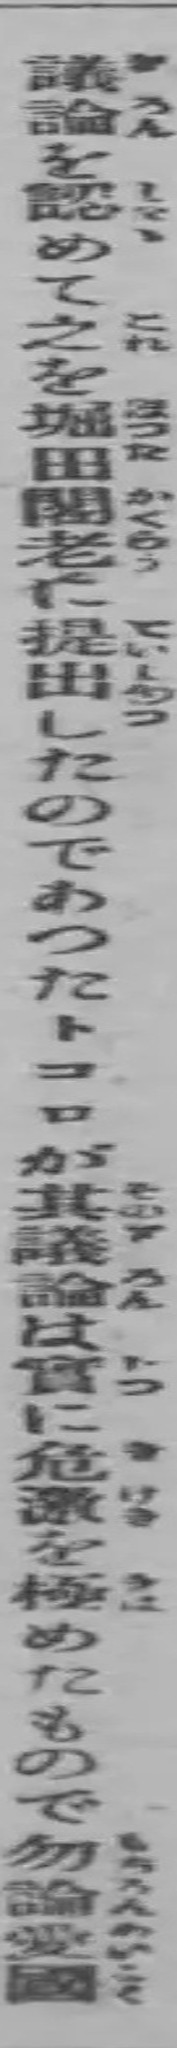議論を認めて之を堀田閣老に提出したのであつたトコロが其議論は実に危激を極めたもので勿論愛国
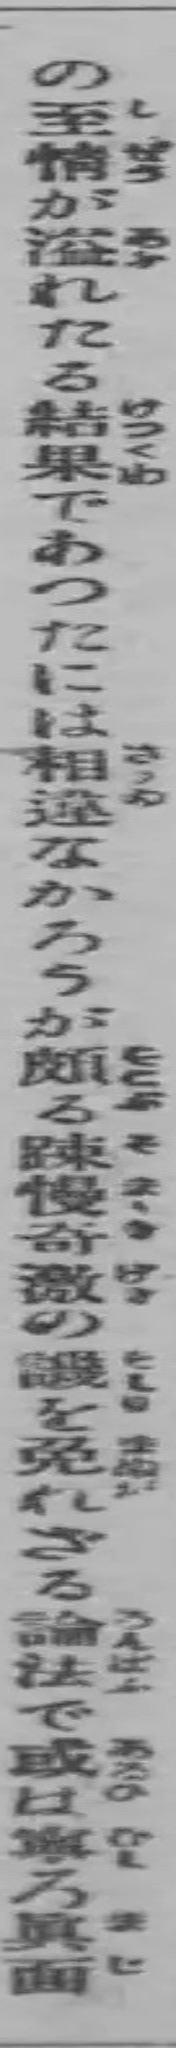の至情が溢れたる結果であつたには相違なかろうが頗る疎慢奇激の譏を免れざる論法で或は寧ろ真面
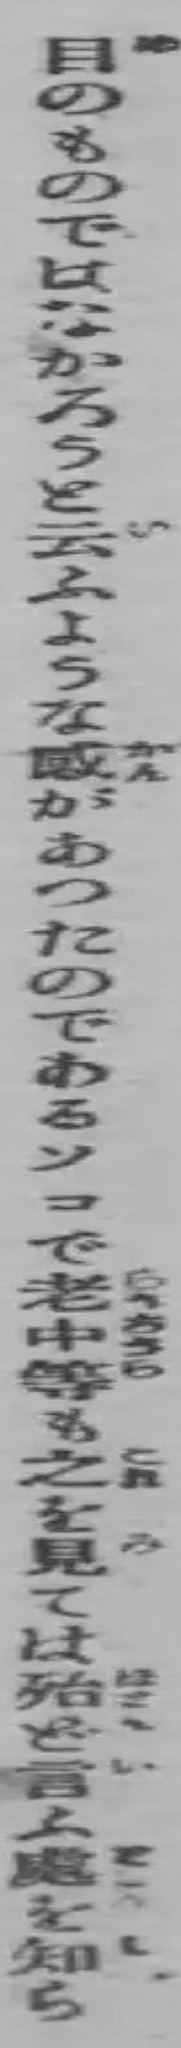目のものではなかろうと云ふような感があつたのであるソコで老中等も之を見ては殆ど言ふ処を知ら
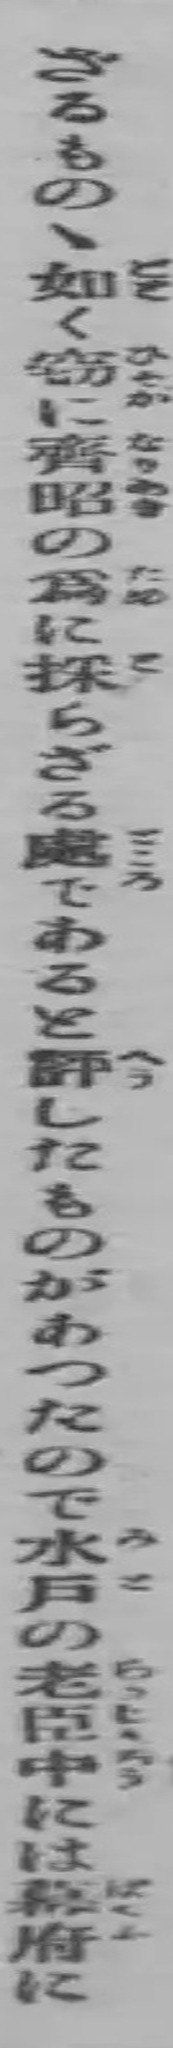ざるものゝ如く窃に斉昭の為に採らざる処であると評したものがあつたので水戸の老臣中には幕府に
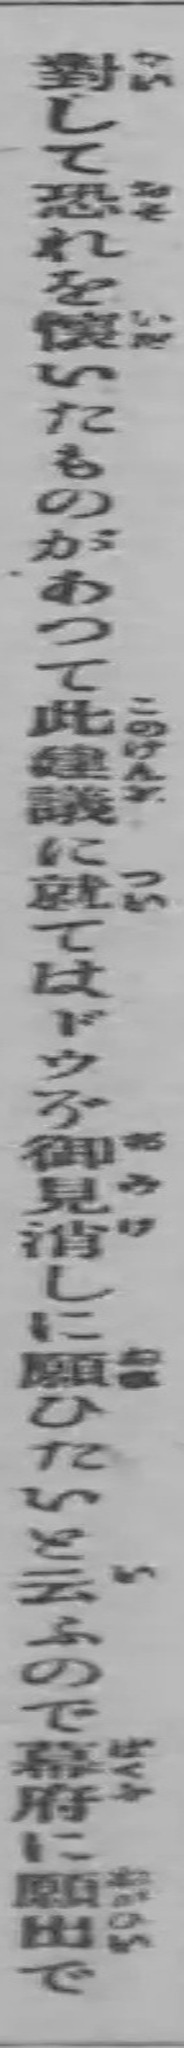対して恐れを懐いたものがあつて此建議に就てはドウぞ御見消しに願ひたいと云ふので幕府に願出で
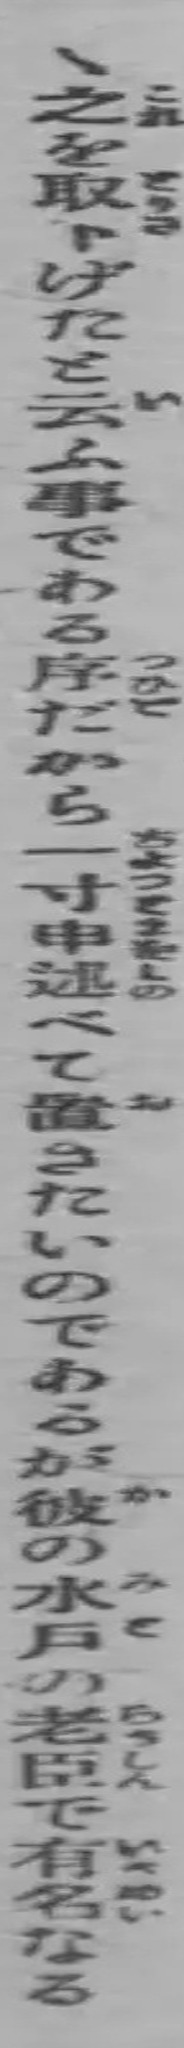ゝ之を取下げたと云ふ事である序だから一寸申述べて置きたいのであるが彼の水戸の老臣で有名なる

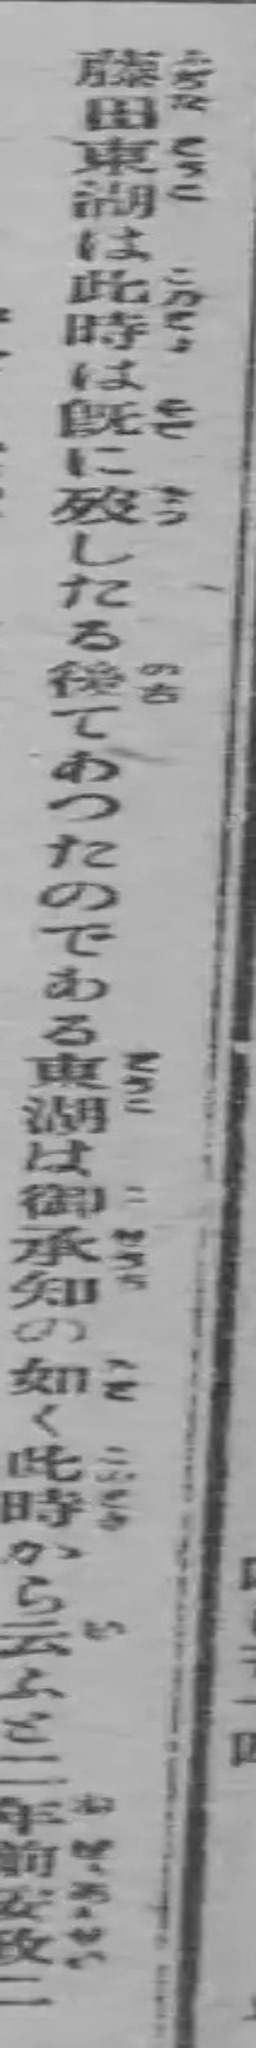藤田東湖は此時は既に歿したる後であつたのである東湖は御承知の如く此時から云ふと二年前安政二
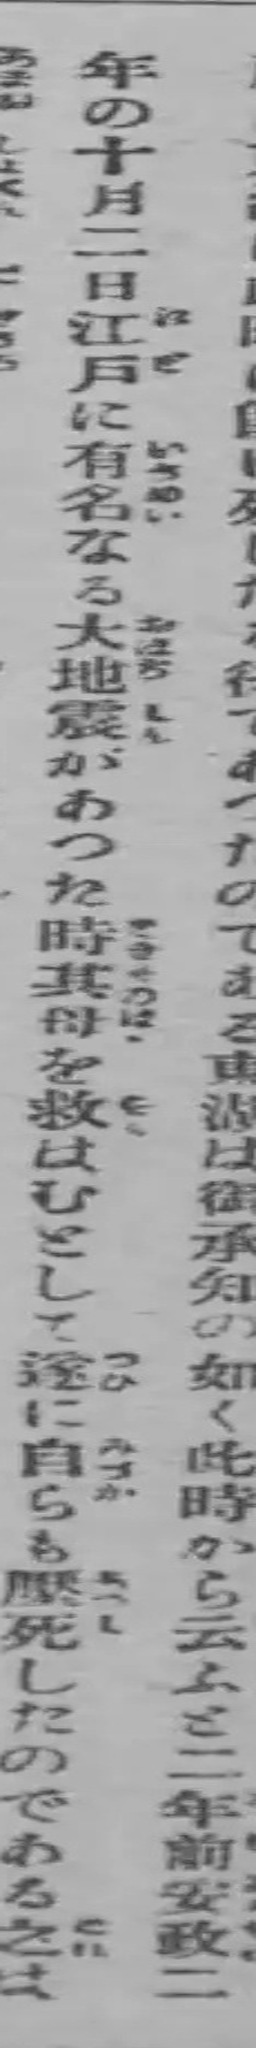年の十二月二日江戸に有名なる大地震があつた時其母を救はむとして遂に自らも圧死したのである之は
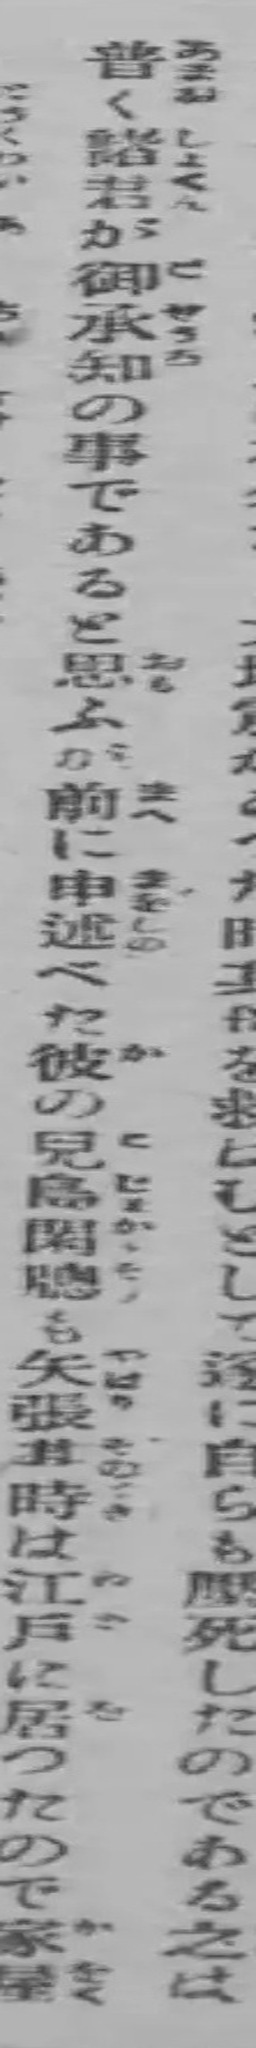普く諸君が御承知の事であると思ふが前に申述べた彼の児島閑牕も矢張其時は江戸に居つたので家屋
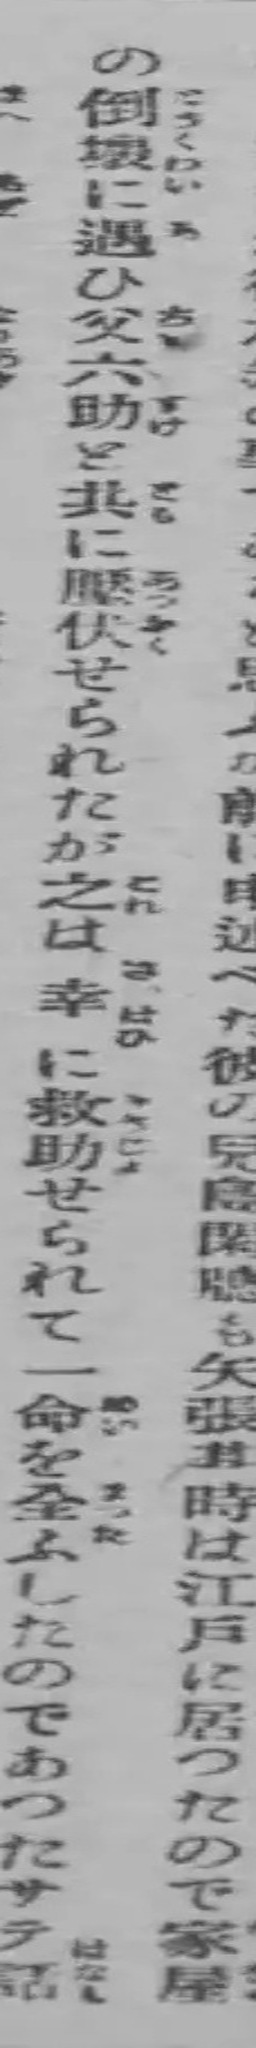の倒壊に遇ひ父六助と共に圧伏せられたが之は幸に救助せられて一命を全ふしたのであつたサテ話
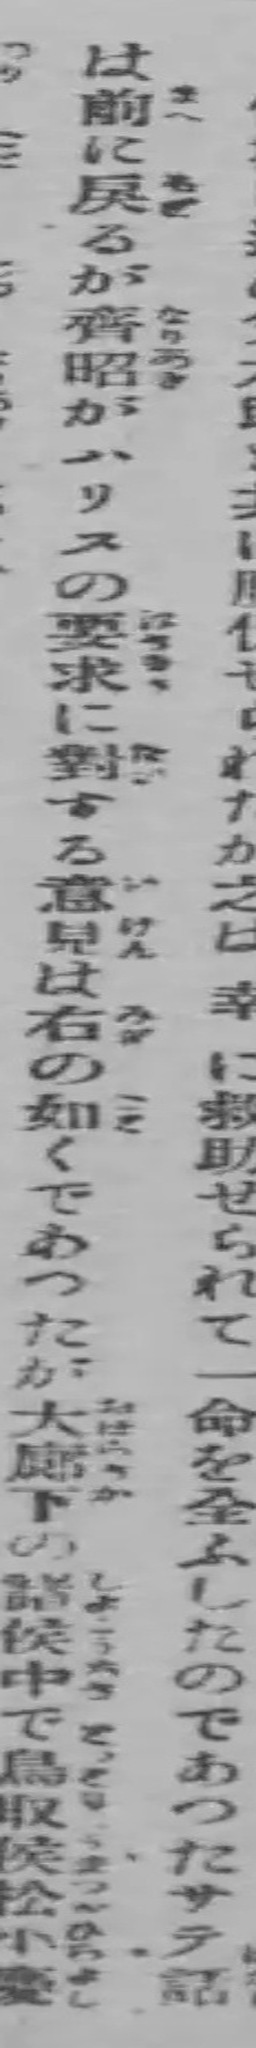は前に戻るが斉昭がハリスの要求に対する意見は右の如くであつたが大廊下の諸侯中で鳥取侯松平慶
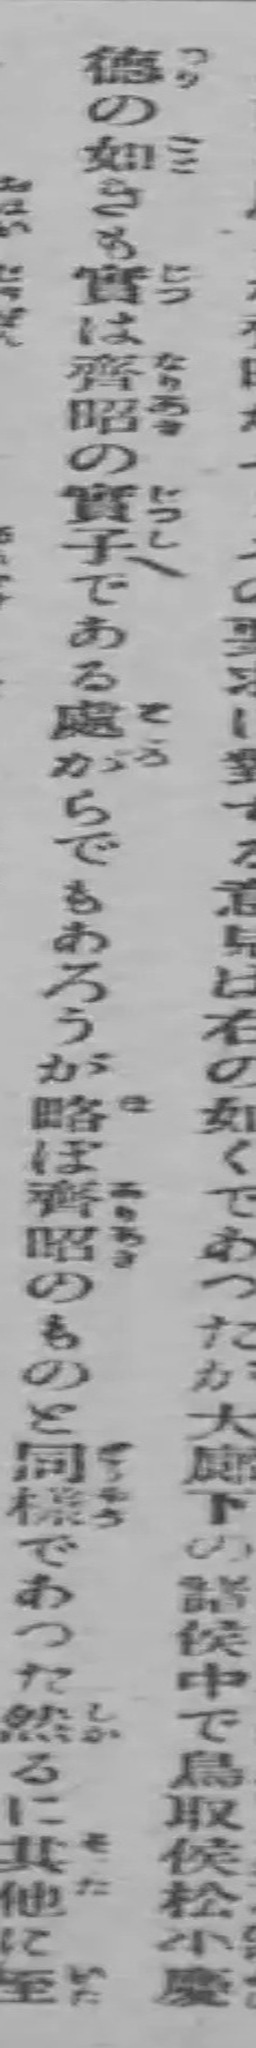徳の如きも実は斉昭の実子である処からでもあろうが略ぼ斉昭のものと同様であつた然るに其他に至
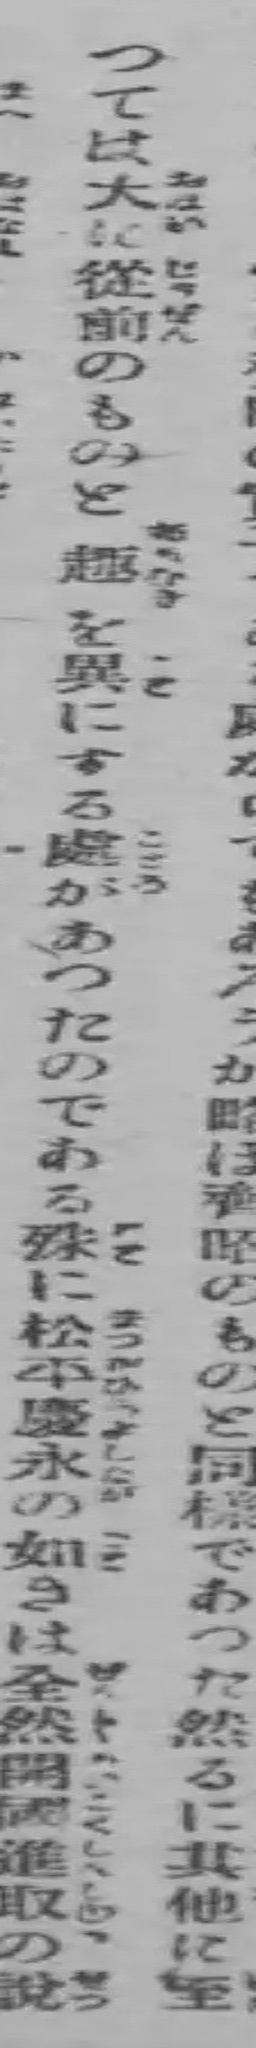つては大に従前のものと趣を異にする処があつたのである殊に松平慶永の如きは全然開国進取の説
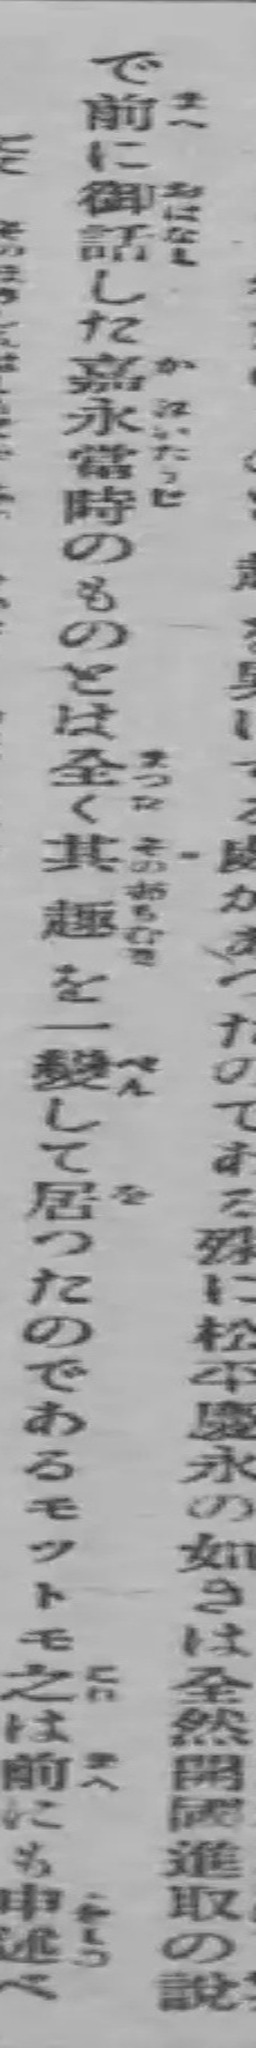で前に御話した嘉永当時のものとは全く其趣を一変して居つたのであるモツトモ之は前にも申述べ
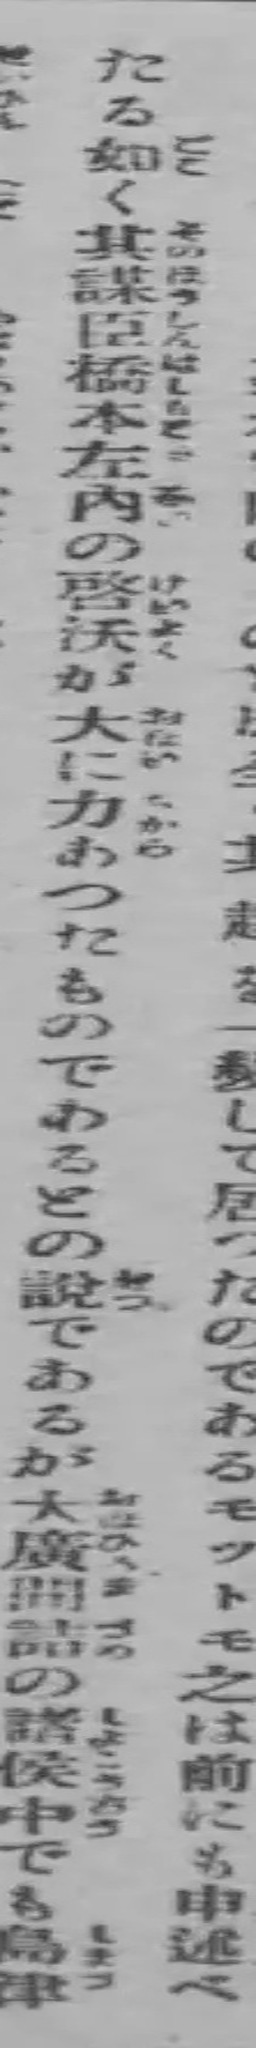たる如く其謀臣橋本左内の啓沃が大に力あつたものであるとの説であるが大広間詰の諸侯中でも島津
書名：豊橋市史談
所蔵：国立国会図書館 National Diet Library, JAPAN
